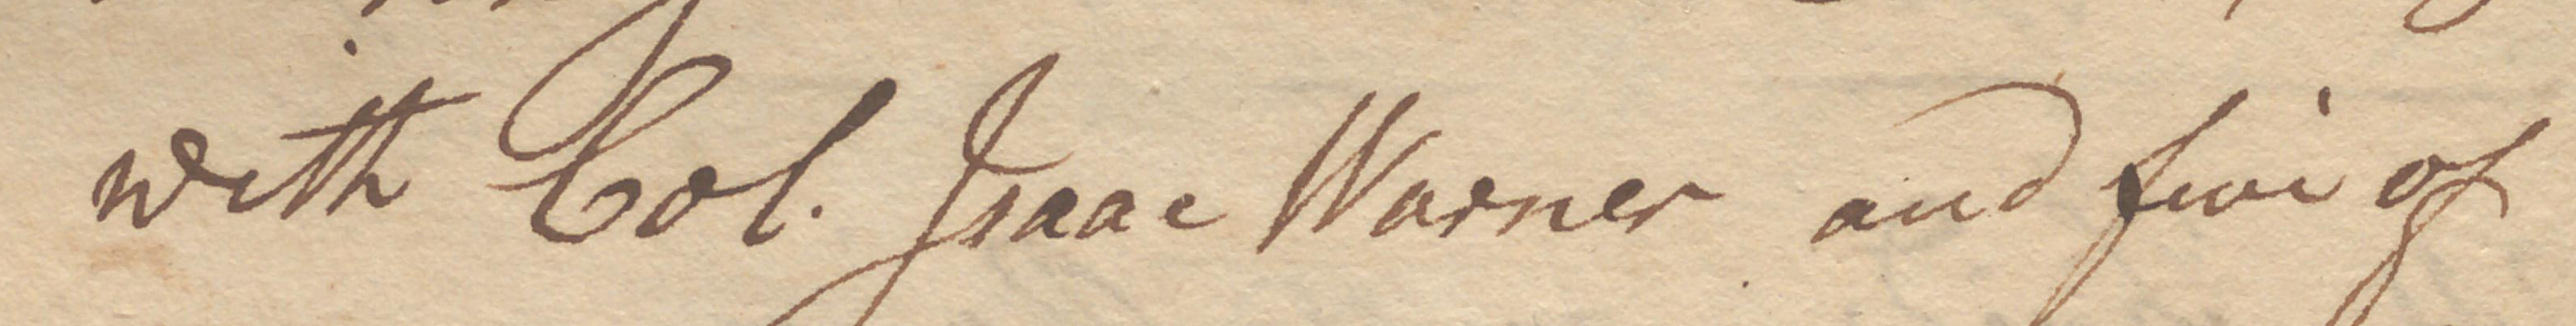with Col. Isaac Warner and five of
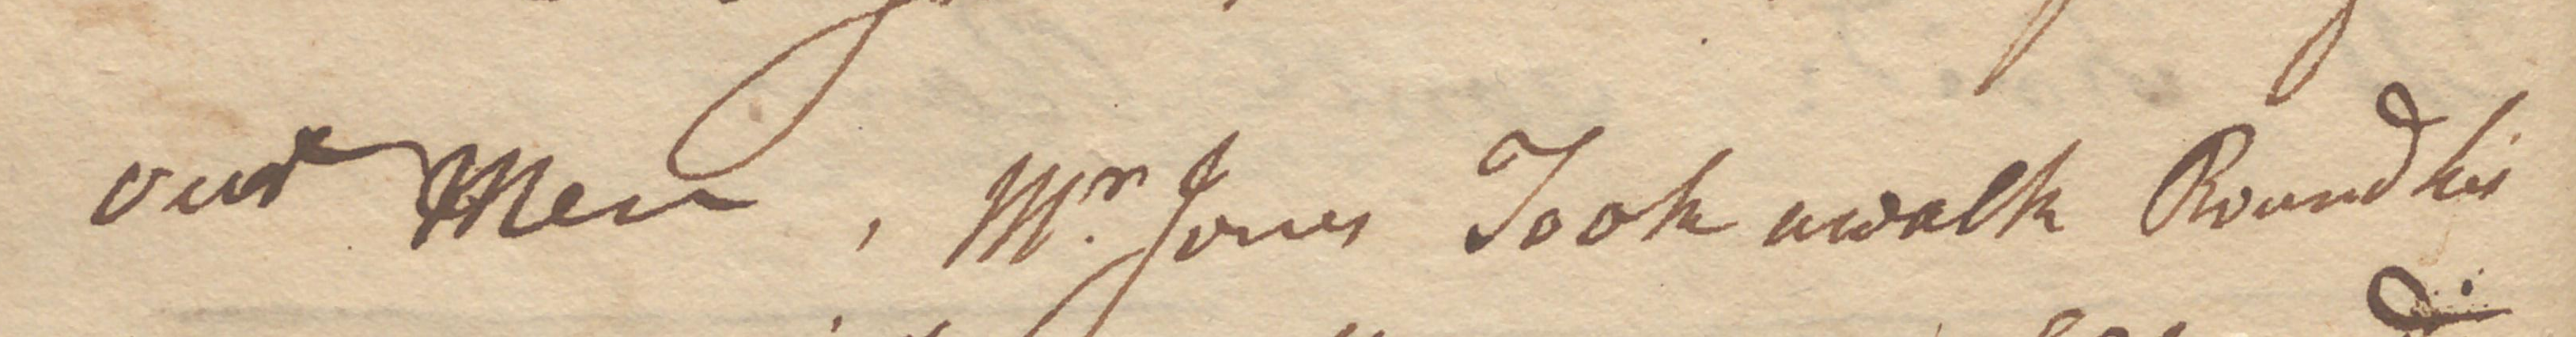our Men, M^r. Jones Took a walk Round his
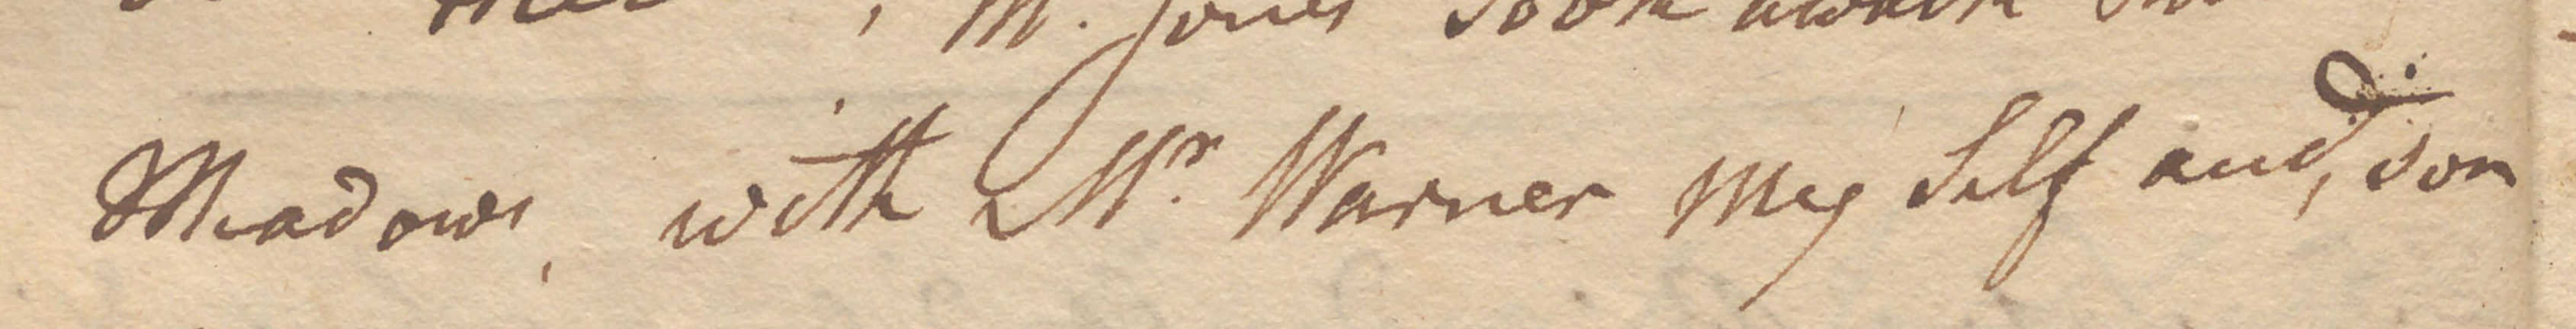Meadows with M^r. Warner My self and, son
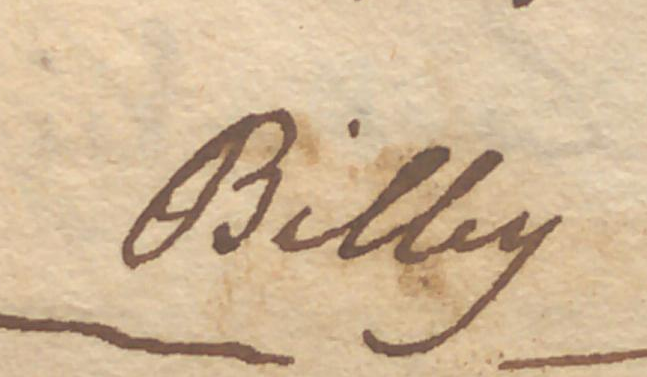Billey
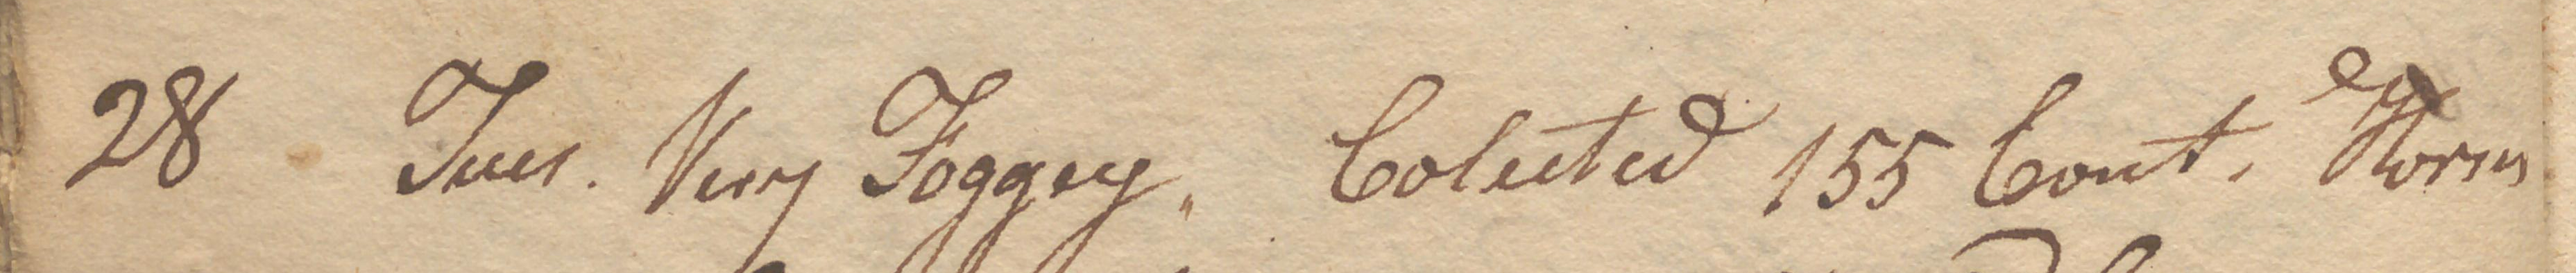28 Tues. Very Foggey. Colected 155 Cont. Horse
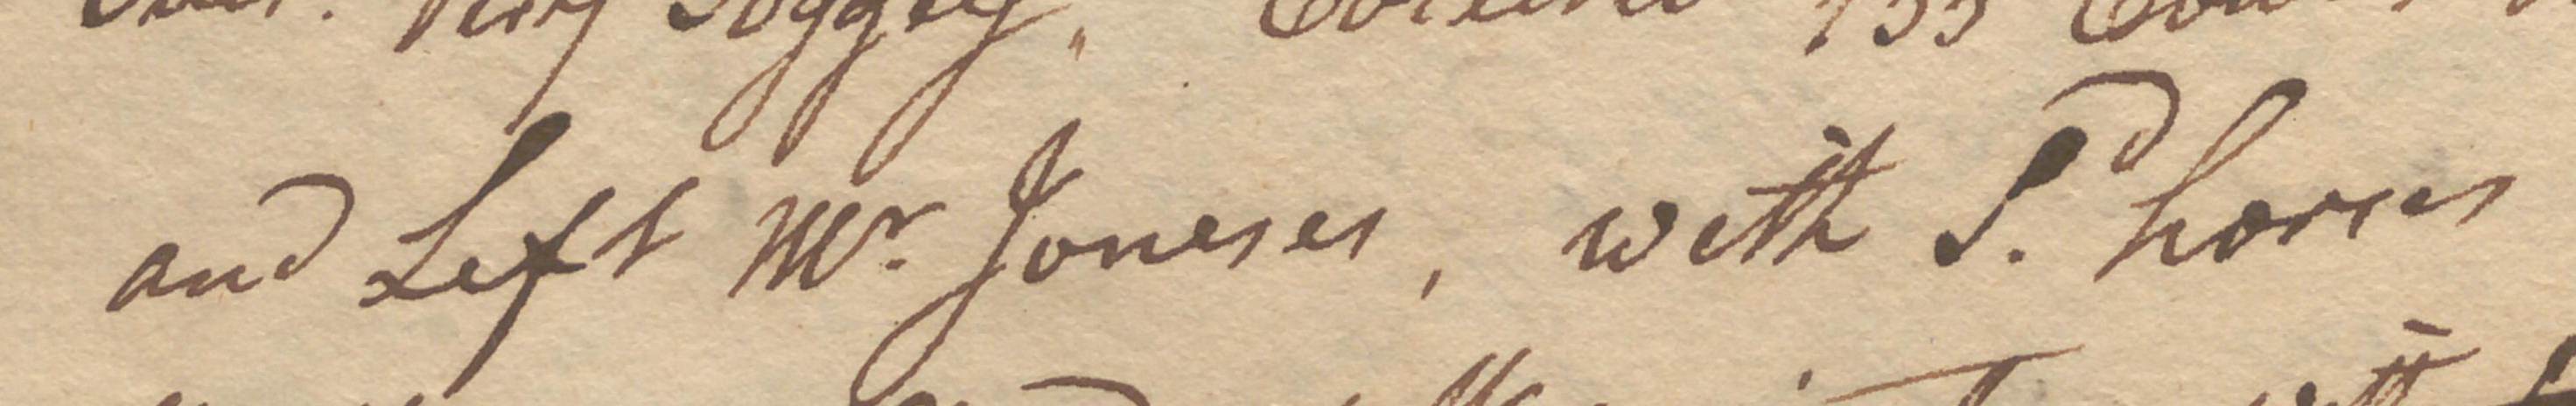and Left M^r. Joneses, with s^d. horses
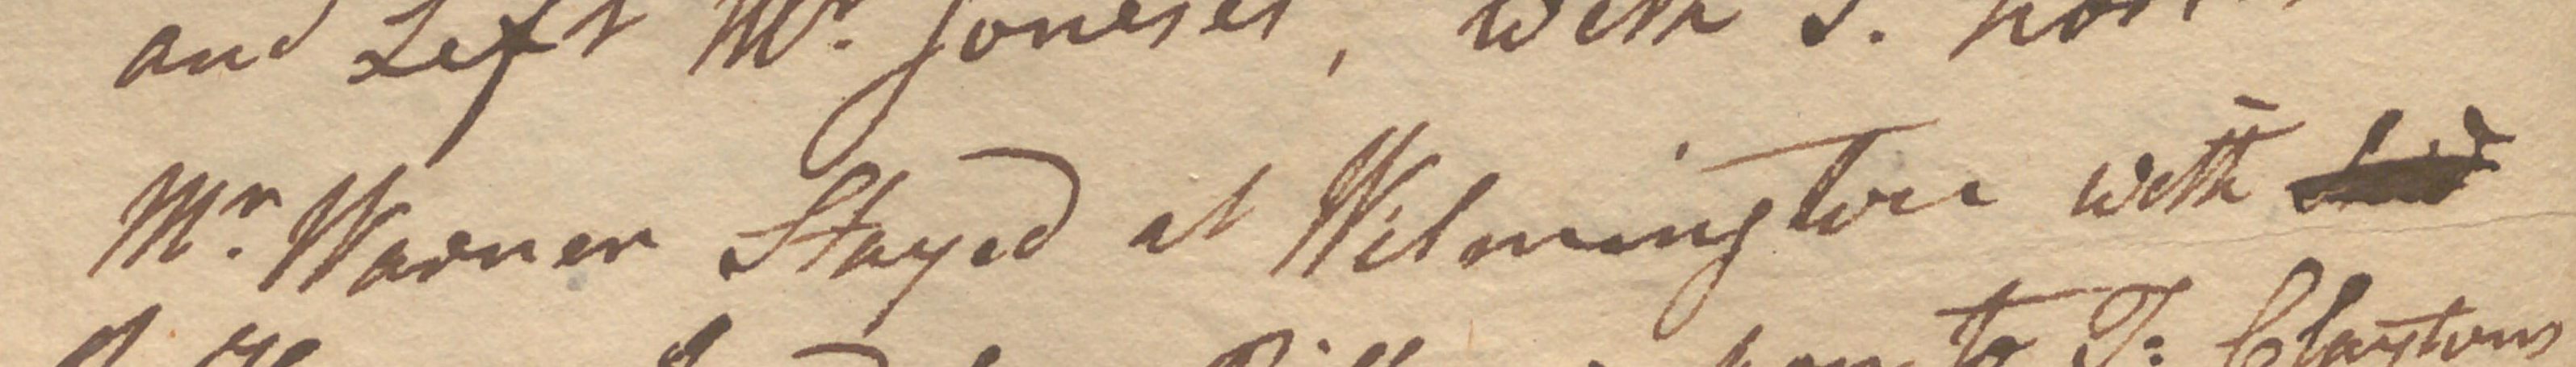M^r. Warner Stayed at Wilmington with [Said]
